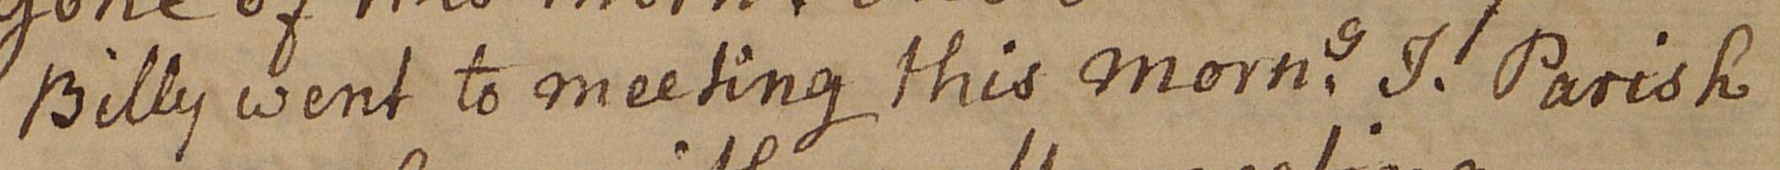Billy went to meeting this morn^g. J. Parish
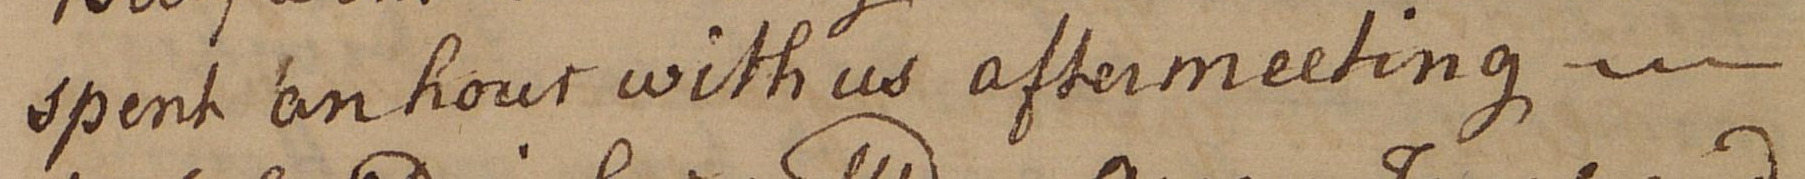spent an hour with us after meeting-
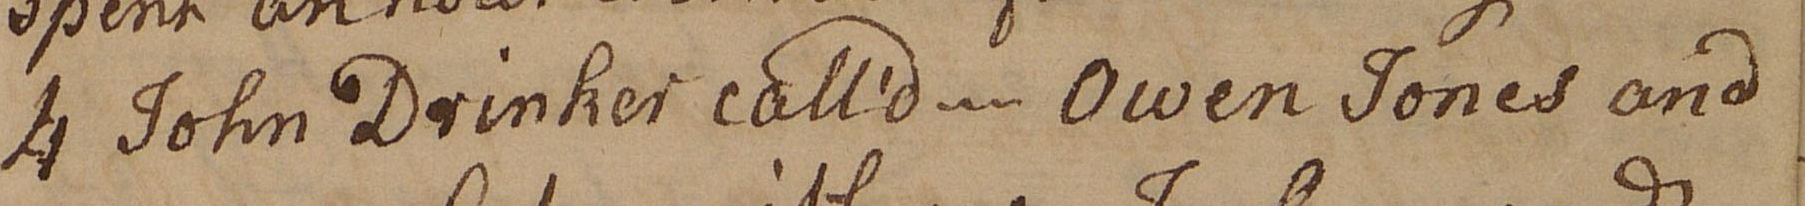4 John Drinker call'd- Owen Jones and
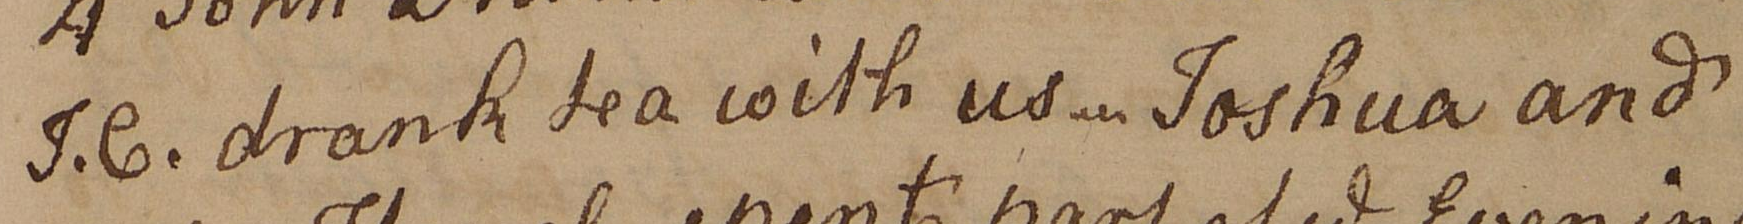J.C. drank tea with us- Joshua and
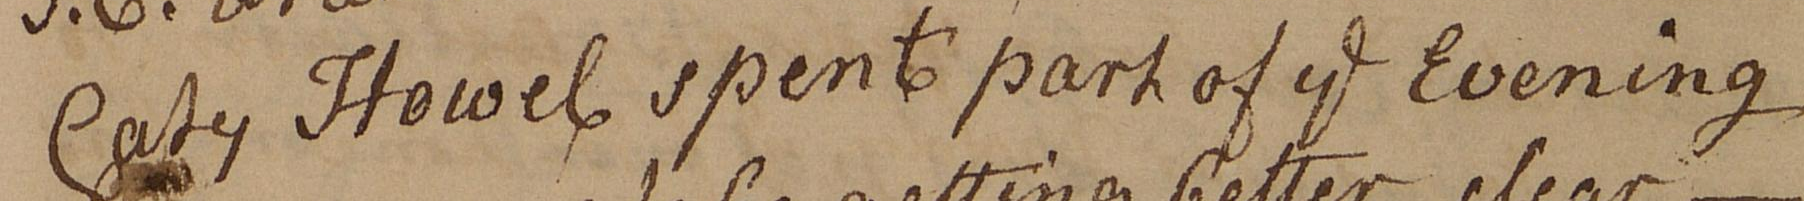Caty Howel spent part of y^e Evening
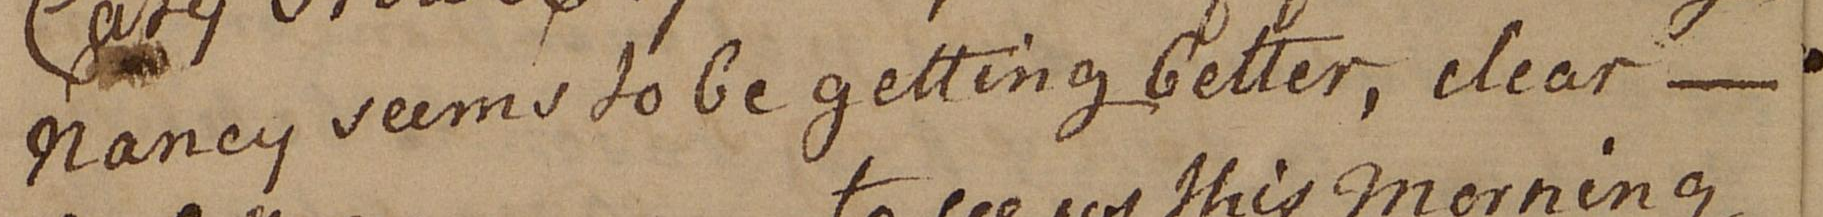Nancy seems to be getting better, clear-
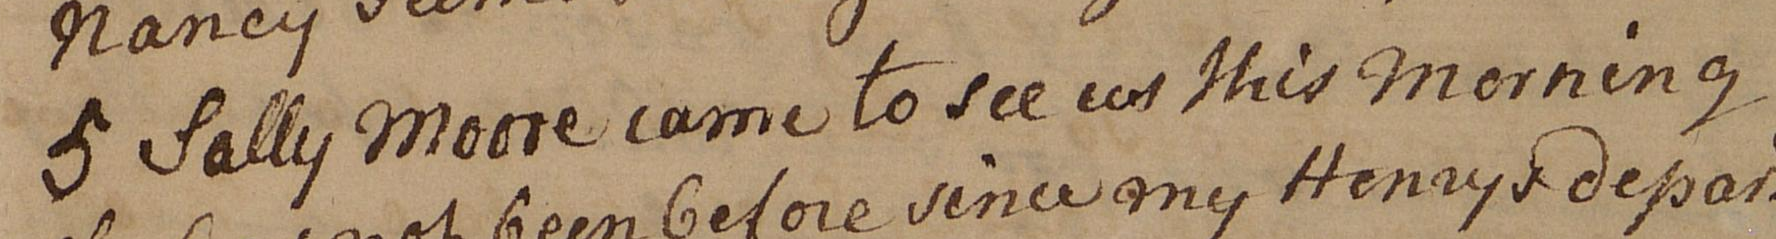5 Sally Moore came to see us this morning
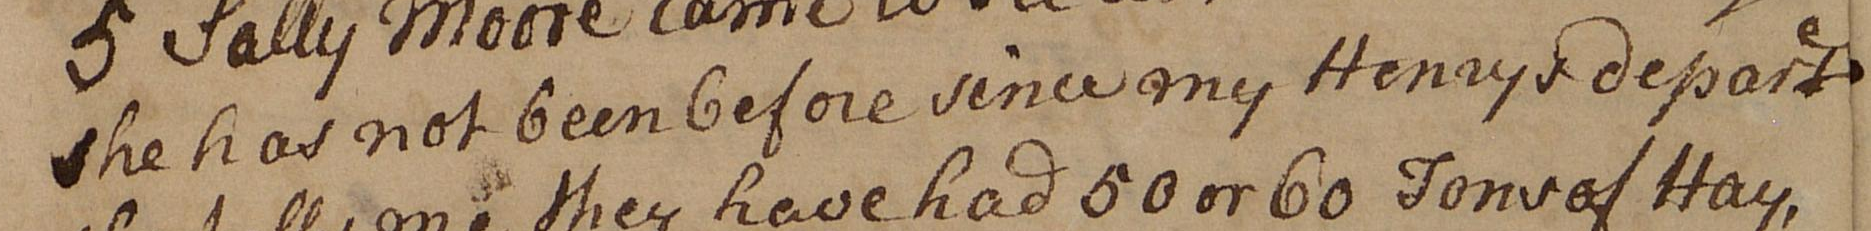she has not been before since my Henrys depart^e
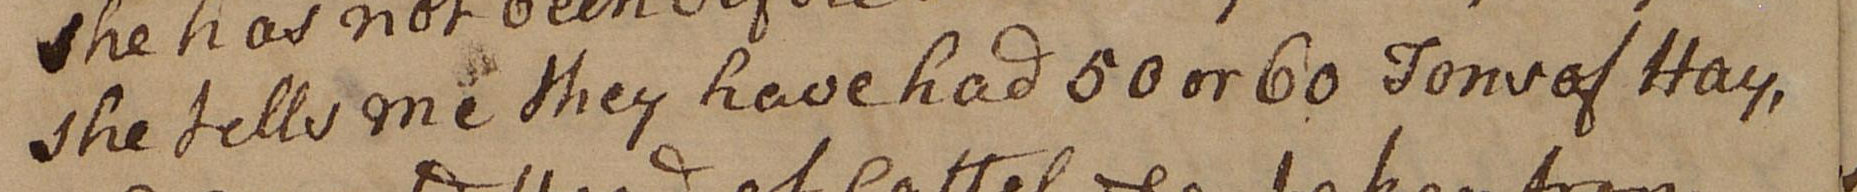she tells me they have had 50 or 60 Tons of Hay,
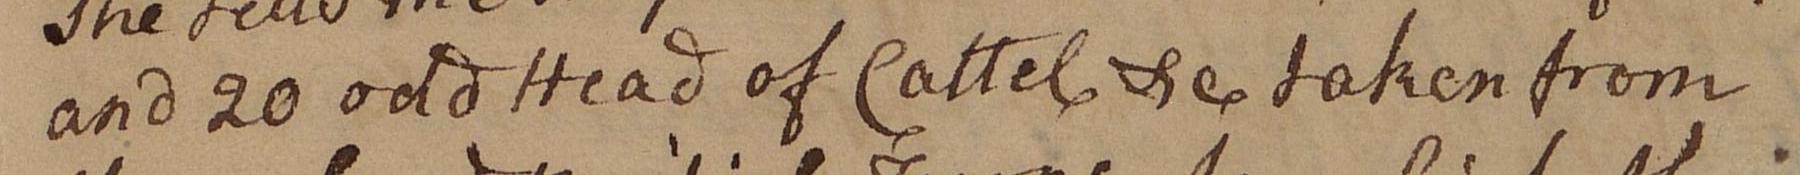and 20 odd Head of Cattel &c taken from
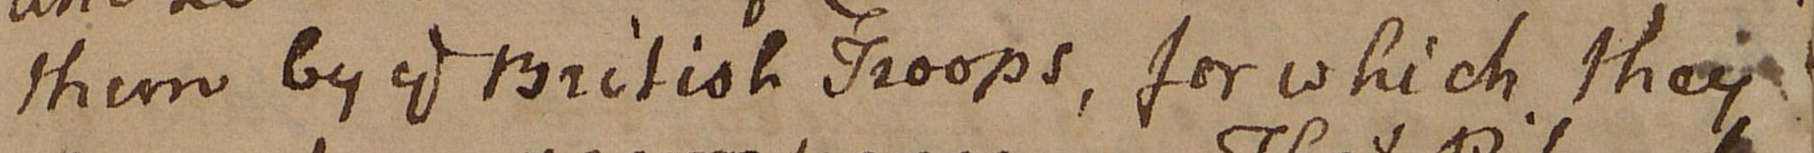them by y^e British Troops, for which they
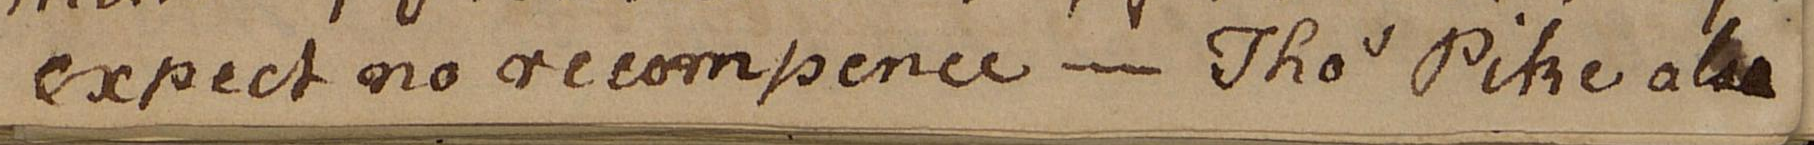expect no recompence- Tho^s Pike also
